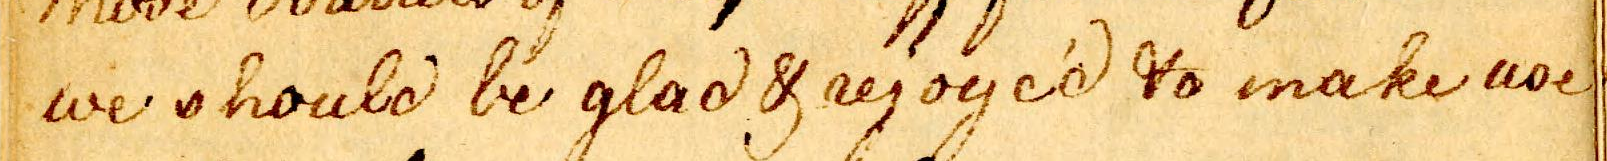we should be glad & rejoyc'd to make use
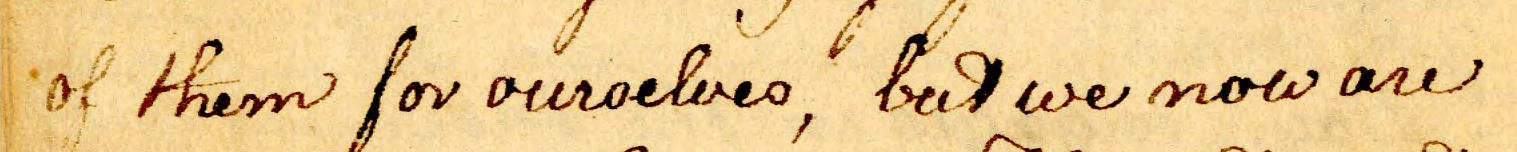of them for ourselves, but we now are
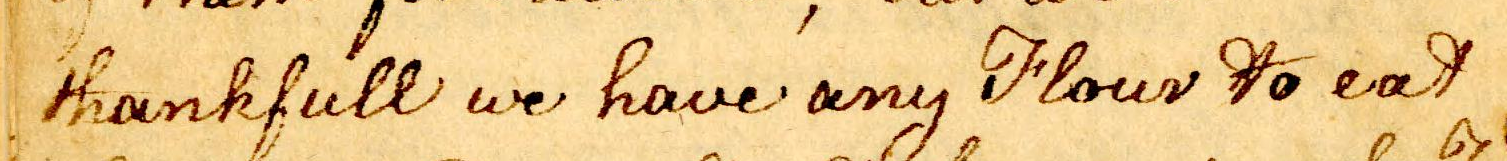thankfull we have any Flour to eat
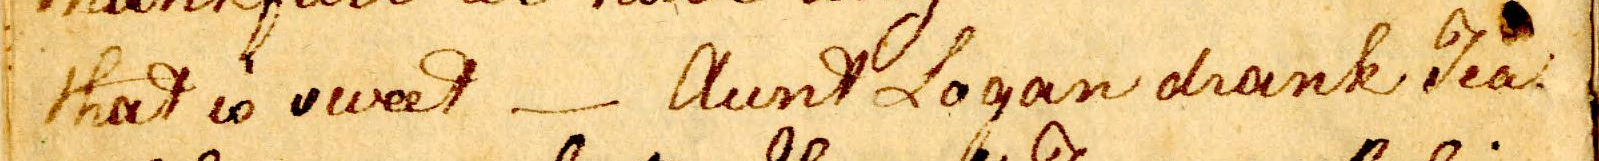that is sweet- Aunt Logan drank Tea
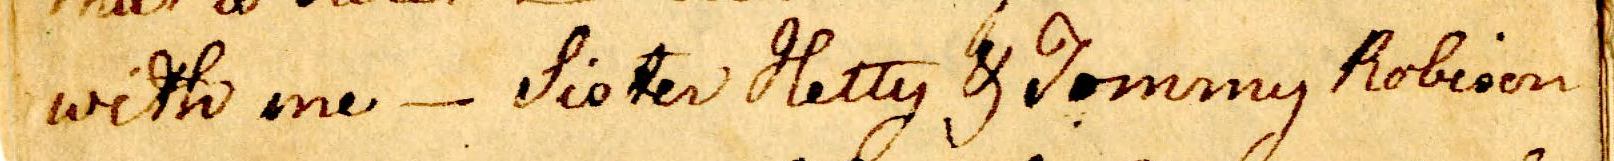with me- Sister Hetty & Tommy Robison
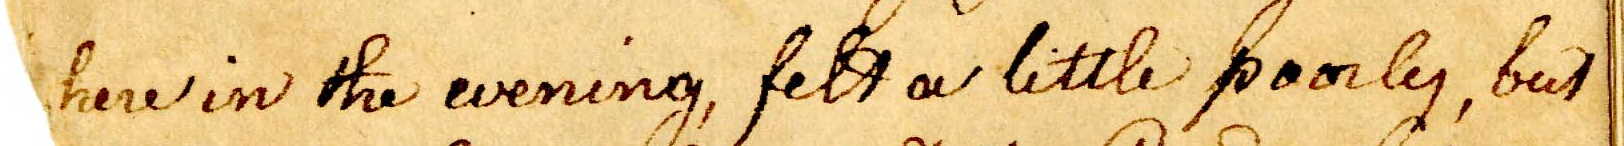here in the evening, felt a little poorly but
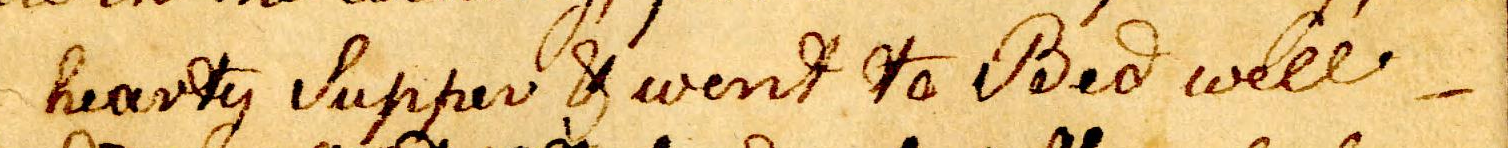hearty Supper & went to Bed well-
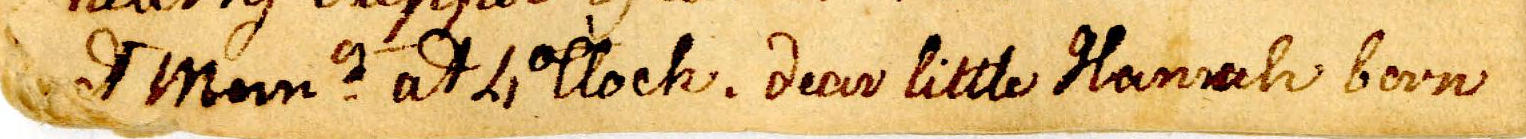Morn^g. at 4 ^o Clock. dear little Hannah born
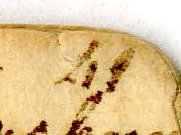41
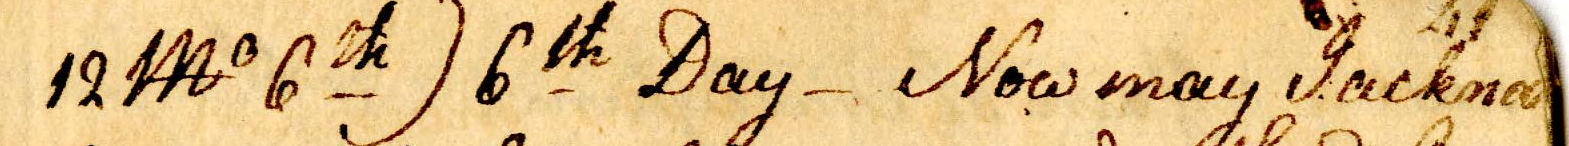12 M^o 6^th) 6^th Day- Now may I ackno
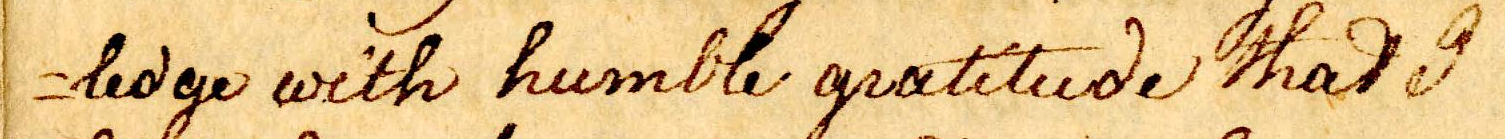-ledge with humble gratitude that I
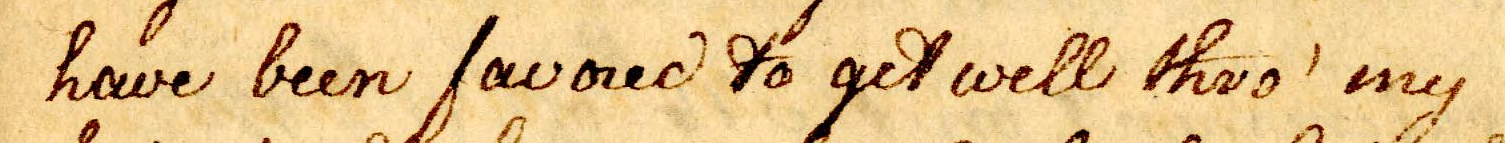have been favored to get well thro' my
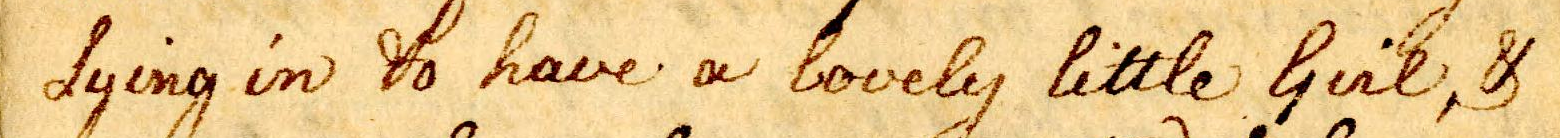Lying in to have a lovely little Girl, &
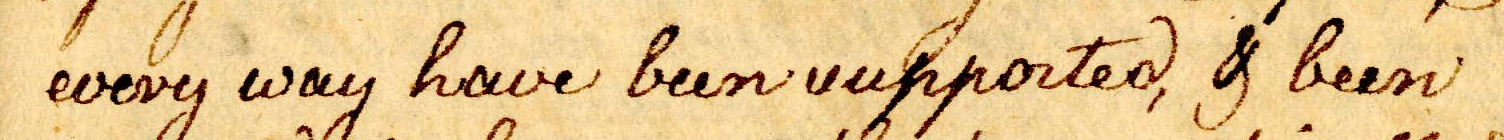every way have been supported, & been
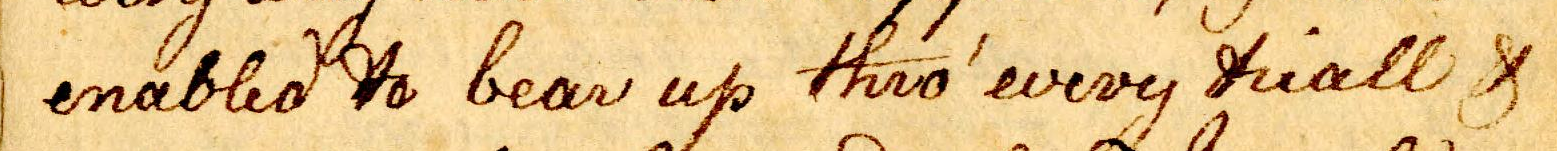enabled to bear up thro' every triall &
